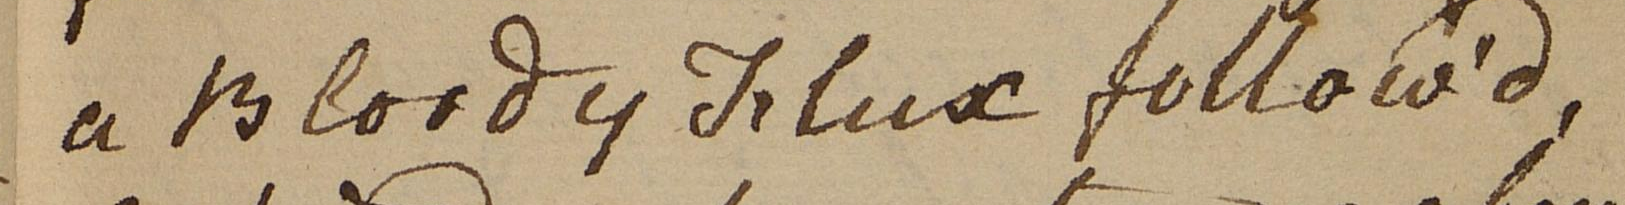a Bloody Flux follow'd,
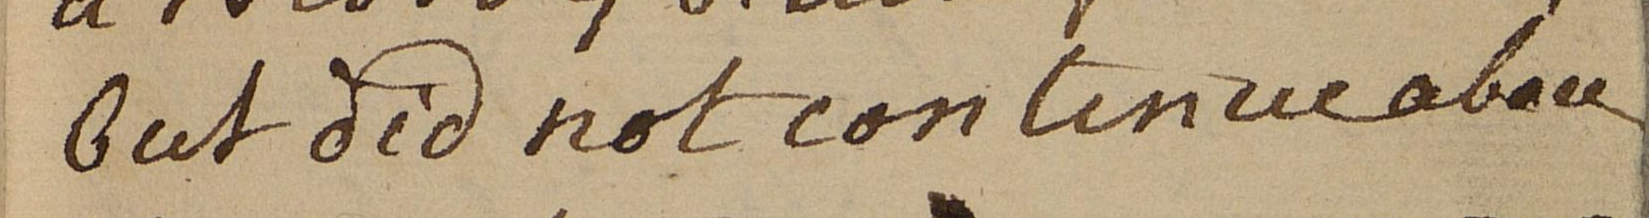but did not continue abou
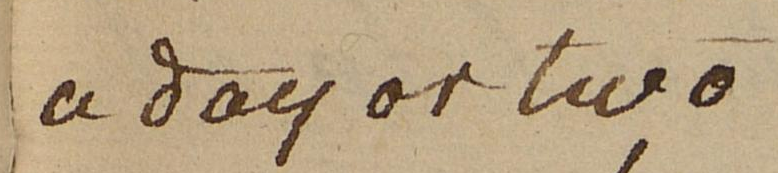a day or two -
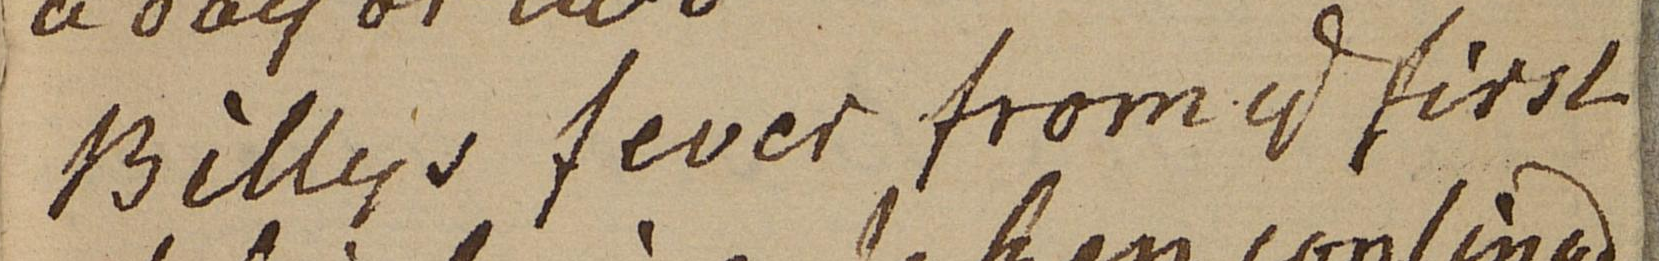Billys fever from y^e first
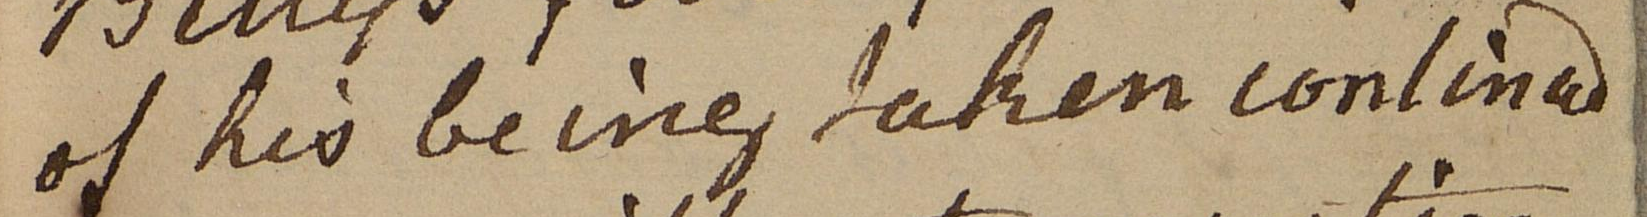of his being taken continud
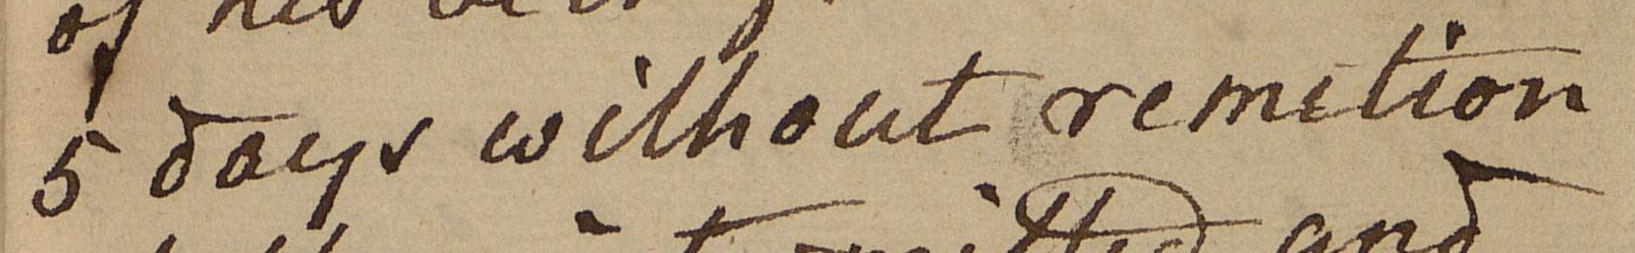5 days without remition
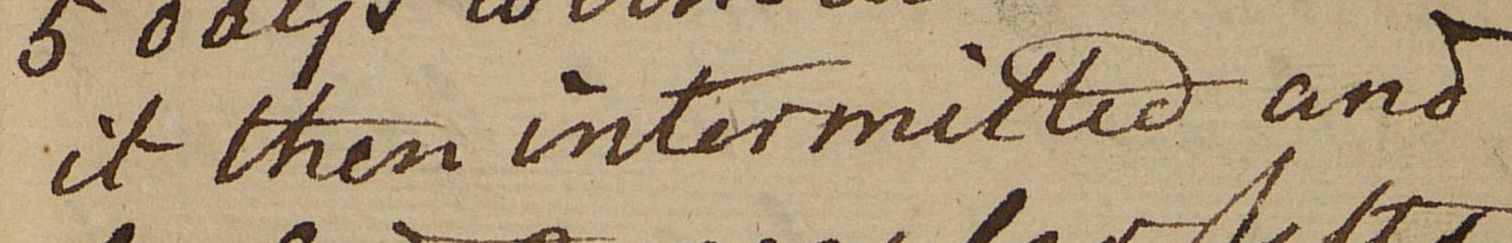it then intermitted and
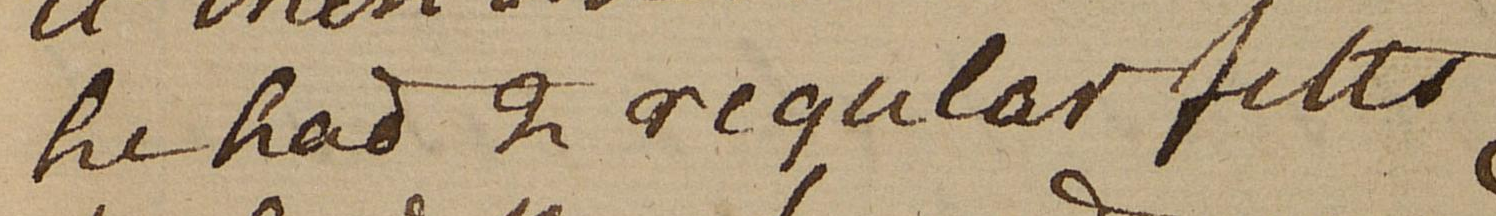he had 2 regular fitts
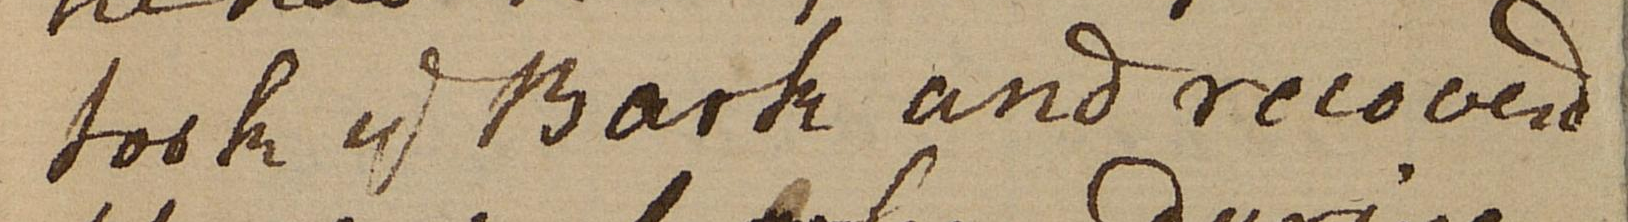took y^e Bark and recoverd
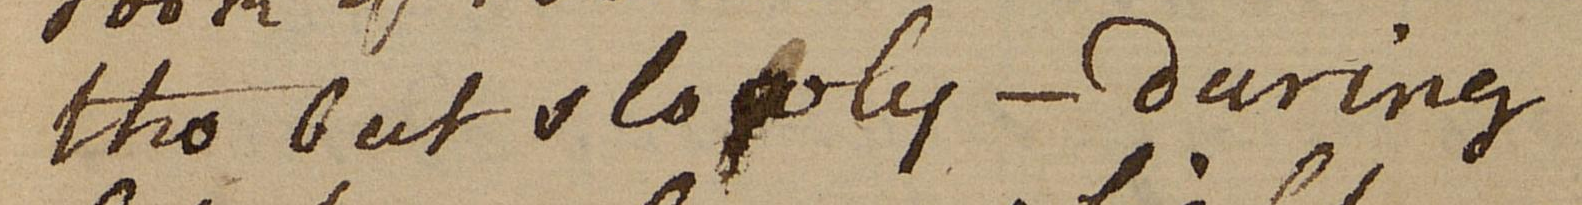tho but slowly- during
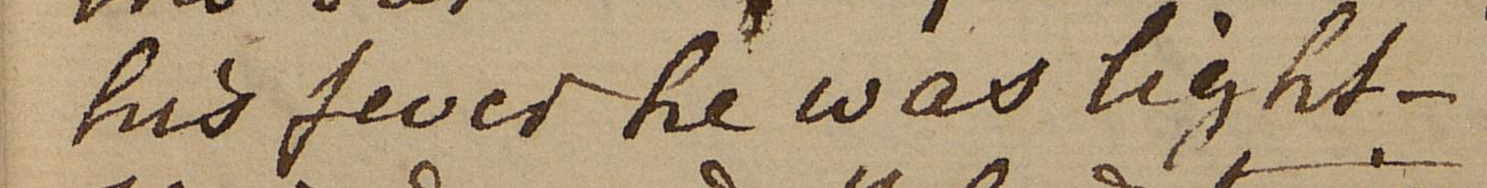his fever he was light-
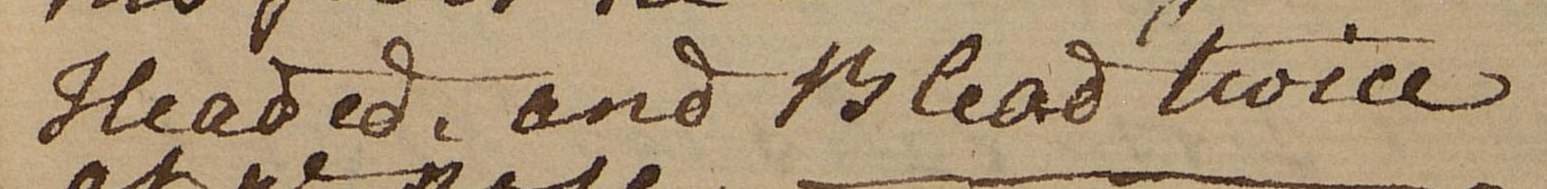Headed, and Blead twice
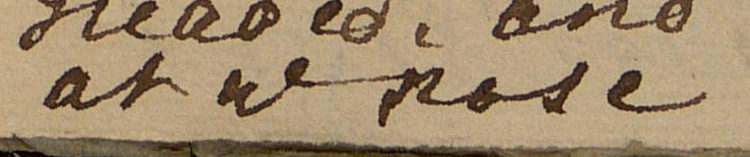at y^e Nose
